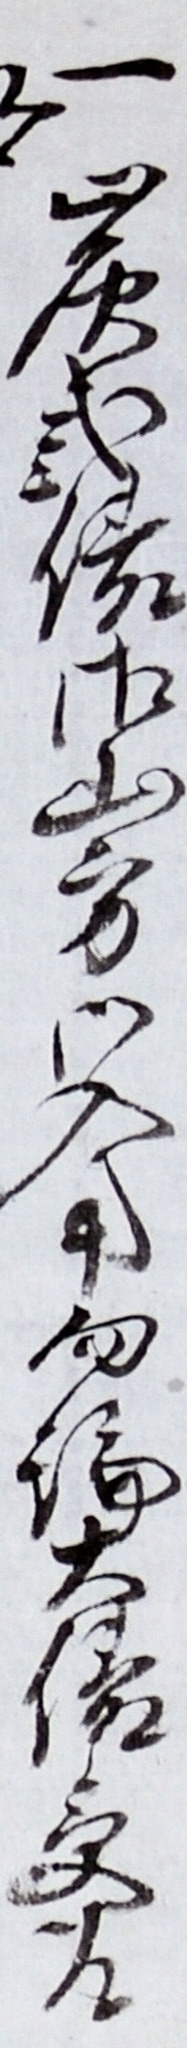一炭弐俵御山方御入用勿論大俵受取
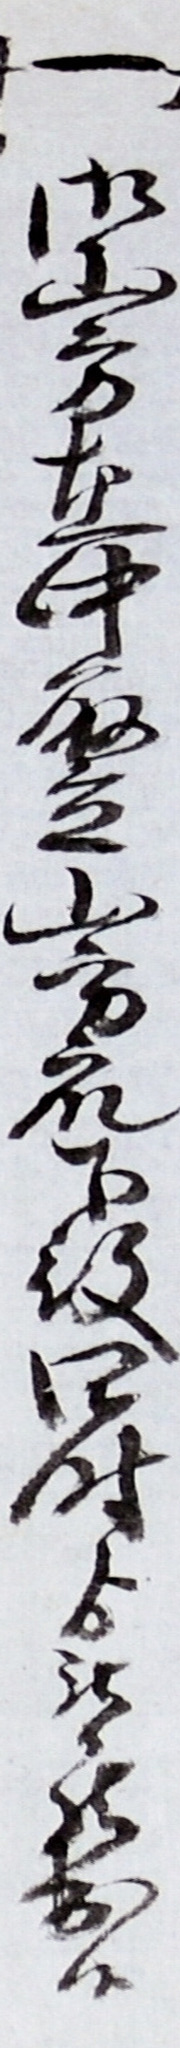一御山方在中取立山方衆下役四時より被罷出候
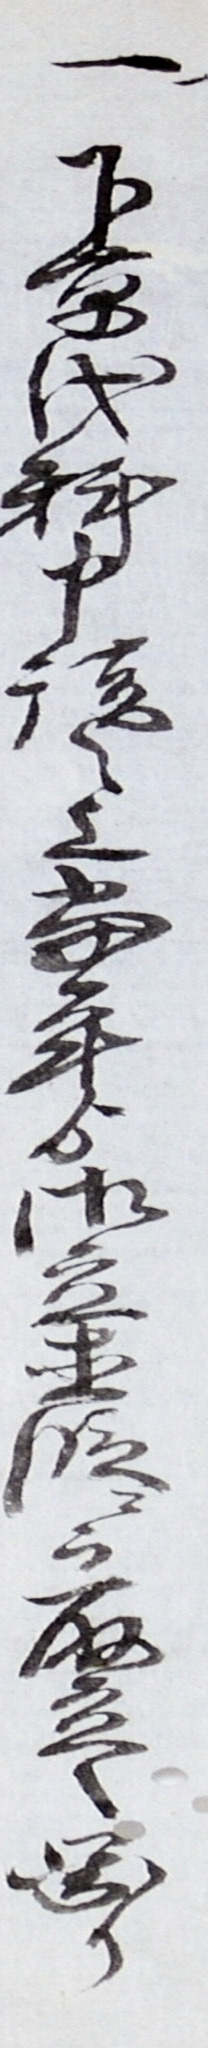一下草代料申談之上当年より御立直段ニ而取立之図り
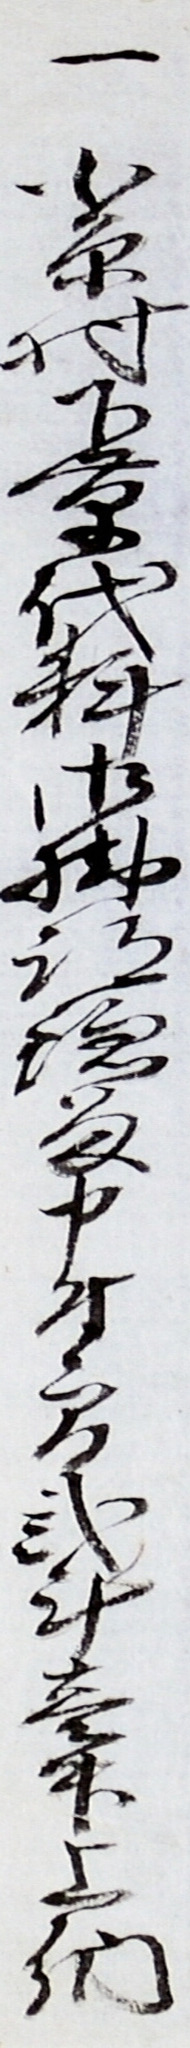一小原村下草代料御払跡隠留申付候間弐斗壱升上納
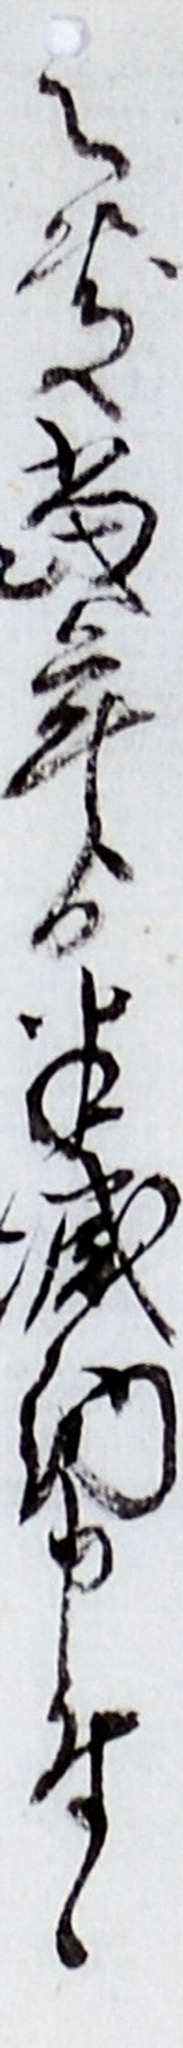之処当年ゟ半減納申付候
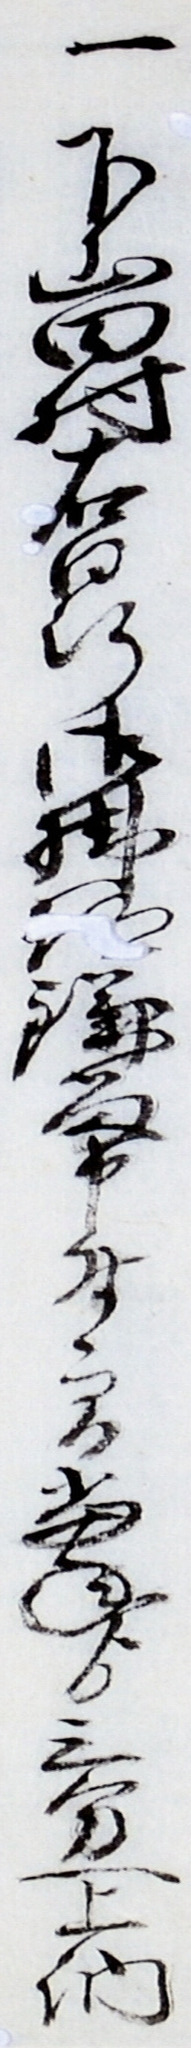一下山田村右同断御払鎌留申付候間当年より三分一上納
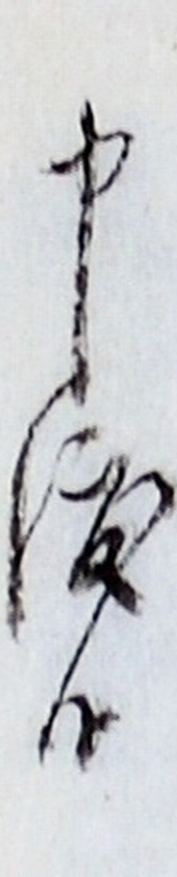申渡候
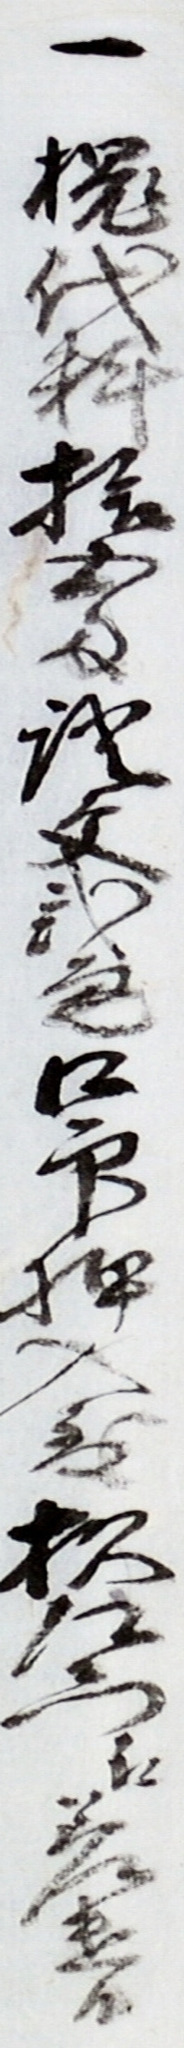一糀代料拾五匁証文弐通郷印押入度杉左衛門江差置候
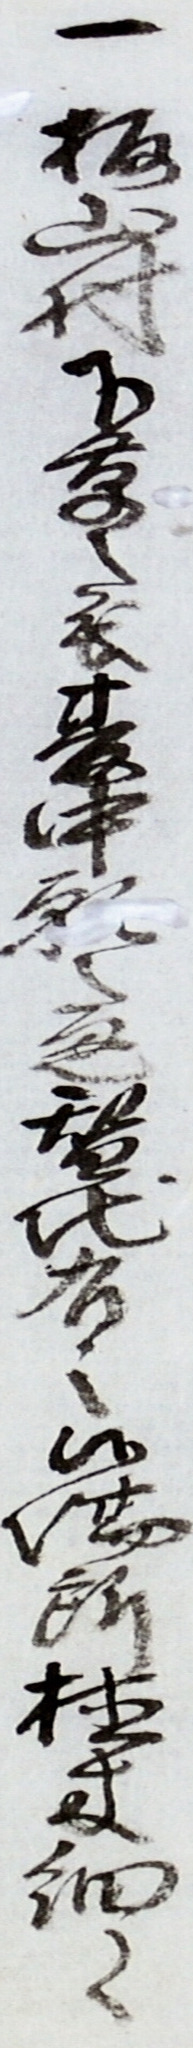一板山村下草之義春中願之通替地有之候場所植木細々
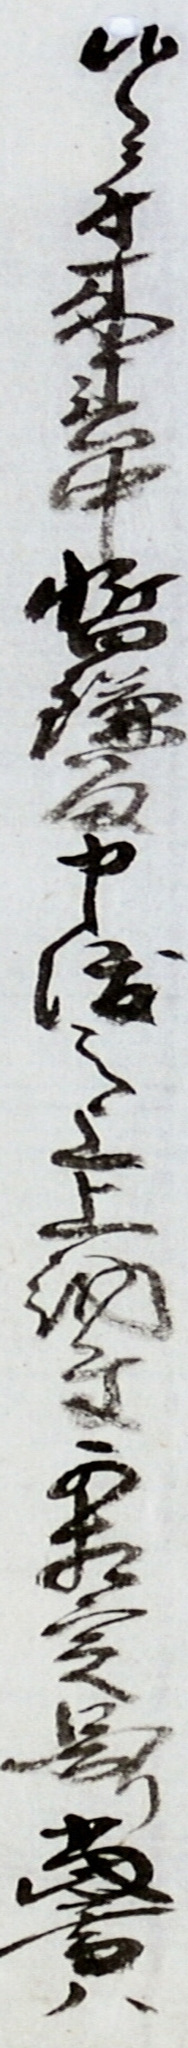候ニ付来春中暫鎌留申渡之上上納米可相定図り当書ハ
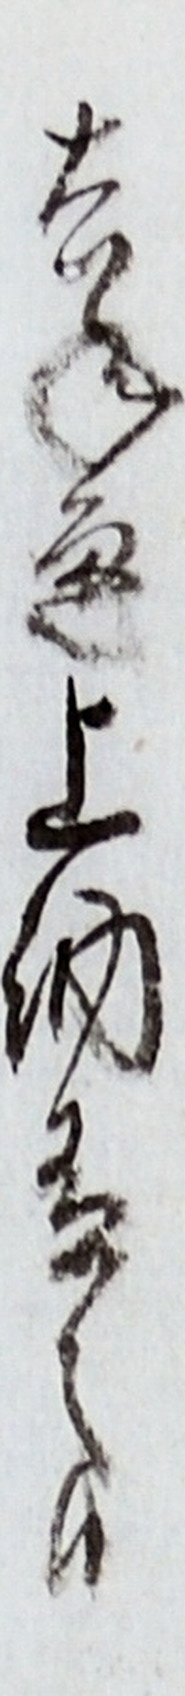去年辺上納有之候
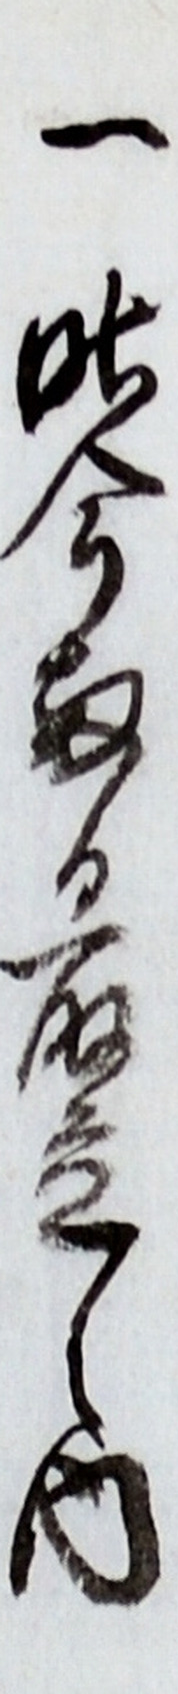一昨今両日取立之内
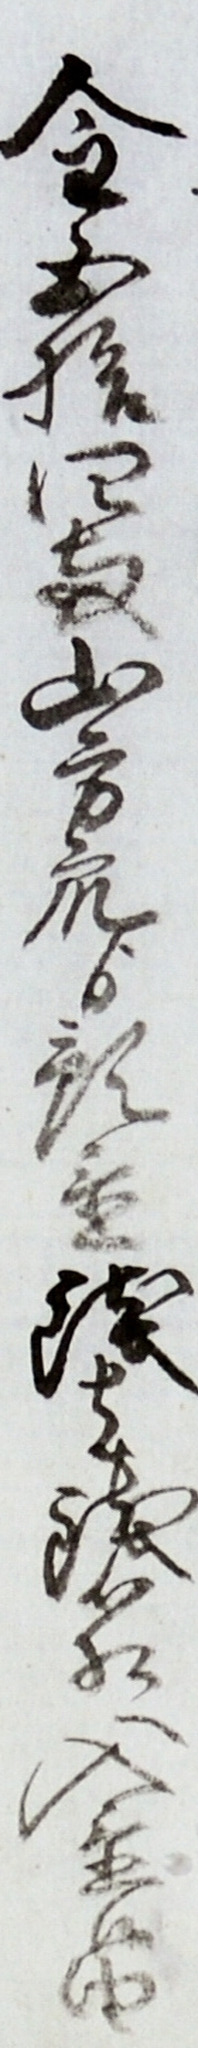金五拾四両山方衆より預置銭者銭箱へ入置候由
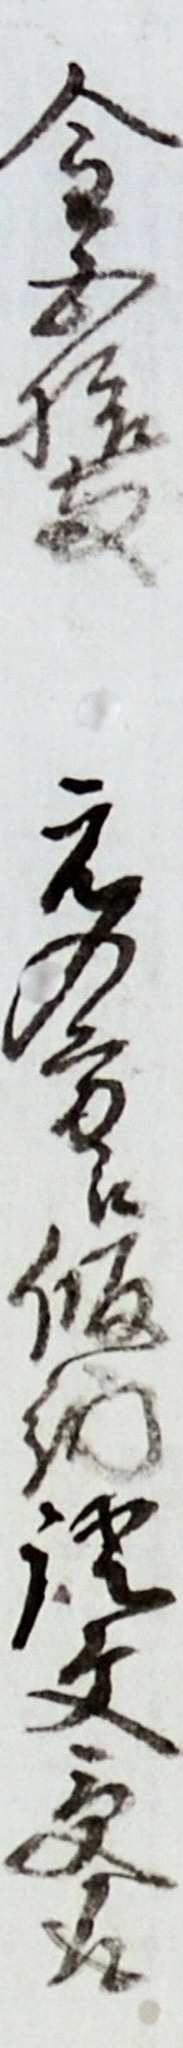金五拾両元元〆方江仮納証文受取
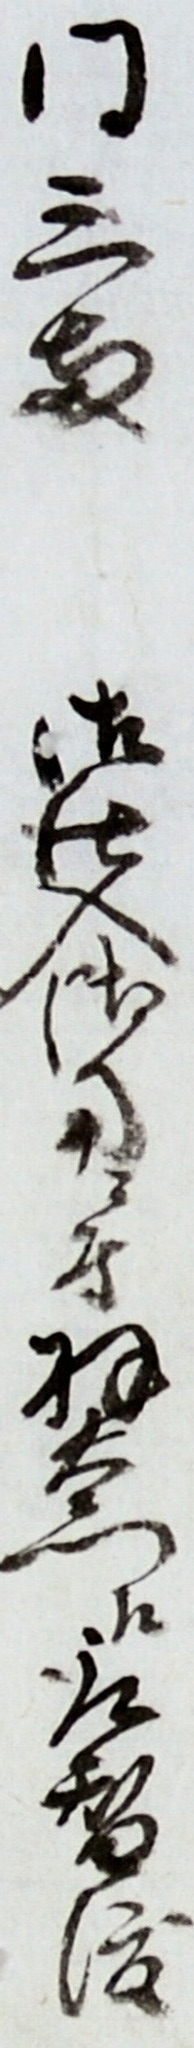同三両御仕入御用ニ付羽右衛門江取替渡
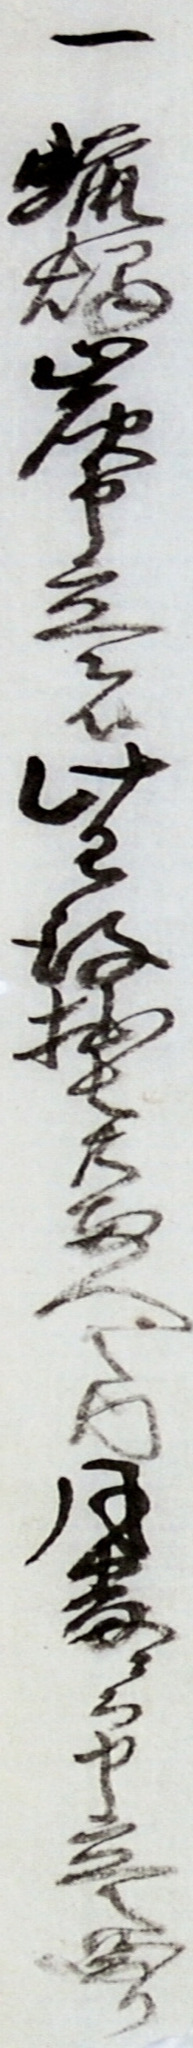一蝋燭炭申立候は此已後拙者は右両人之内月番ニ而申立之図り
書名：御山奉行御用控
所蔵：伊那市立高遠町図書館・合同会社AMANE
